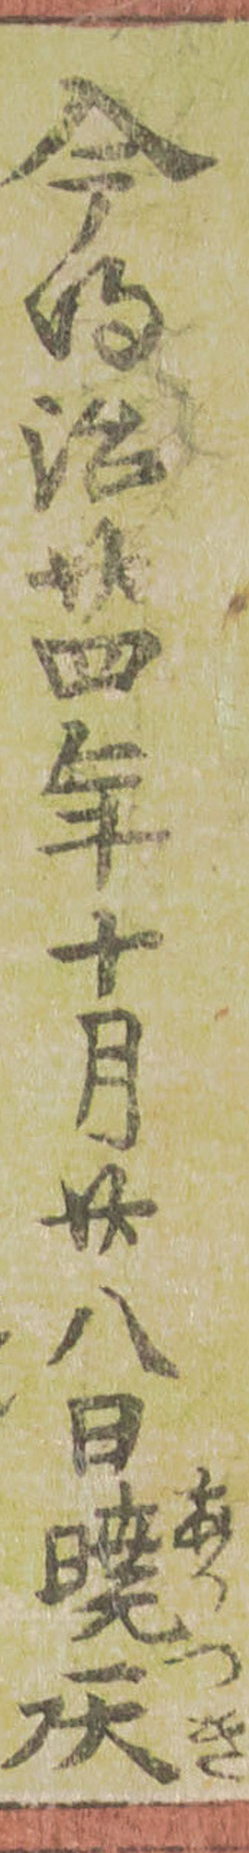今明治廿四年十月廿八日暁天
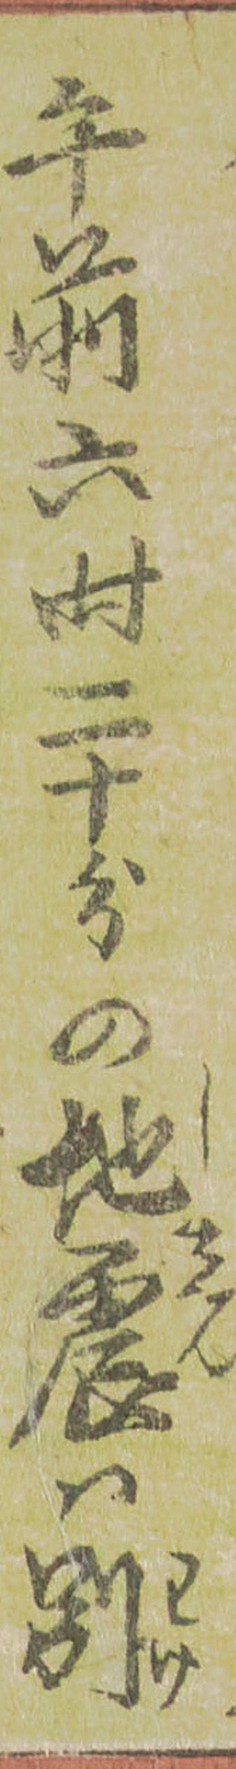午前六時二十分の地震は別
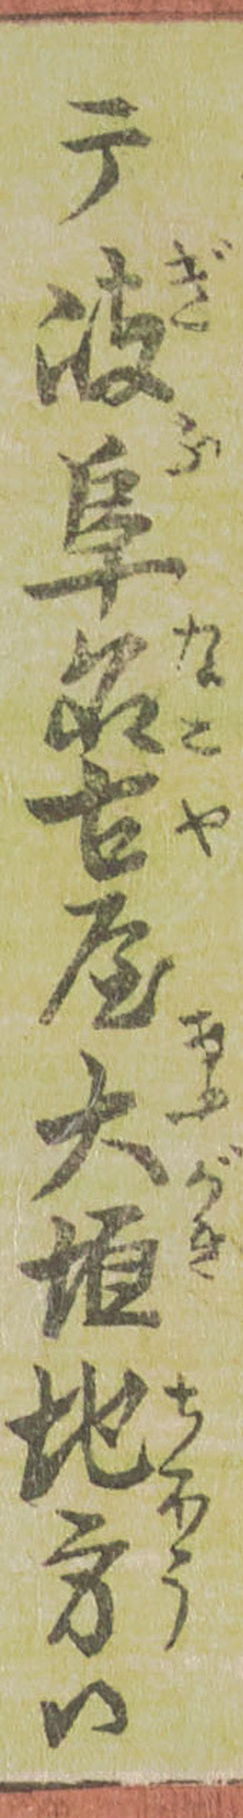て岐阜名古屋大垣地方は
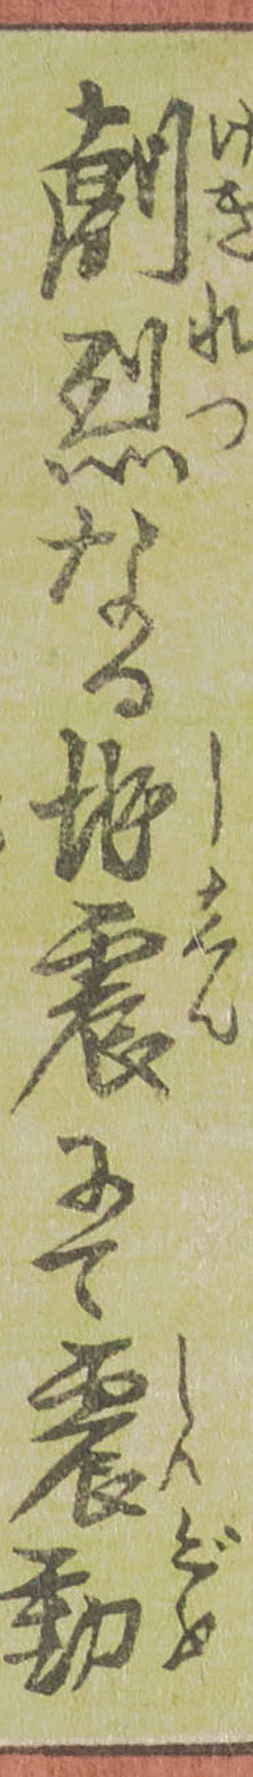劇烈なる地震にて震動
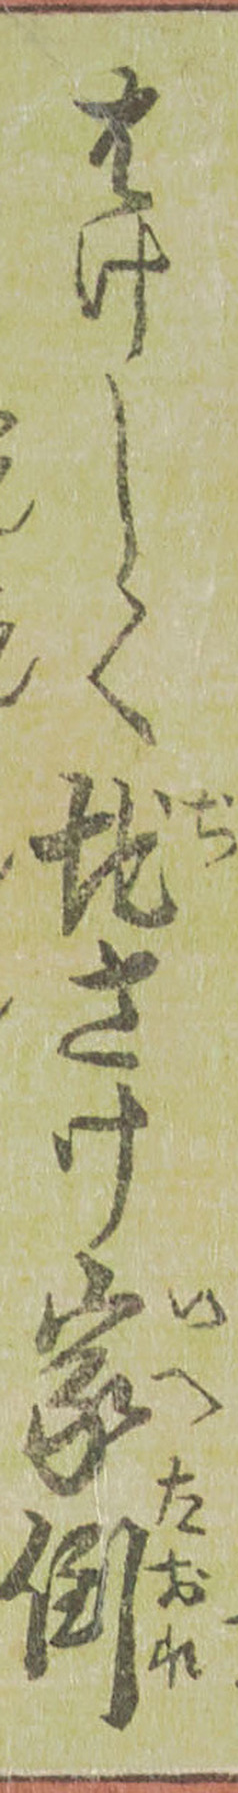はけしく地さけ家倒
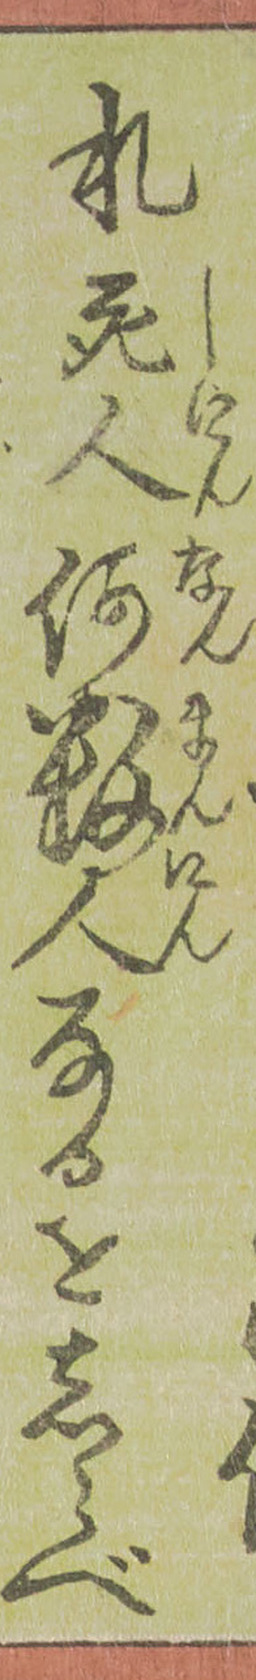れ死人何数人なるをしらべ
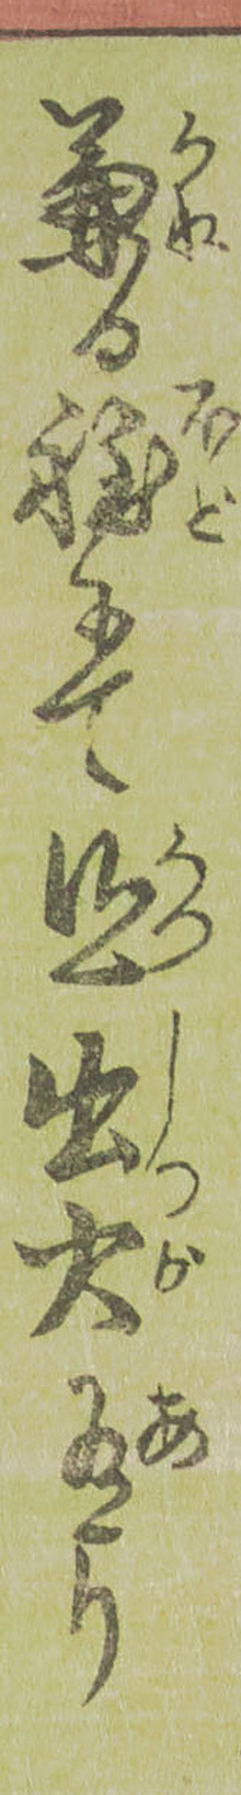兼る程にて且出火有り
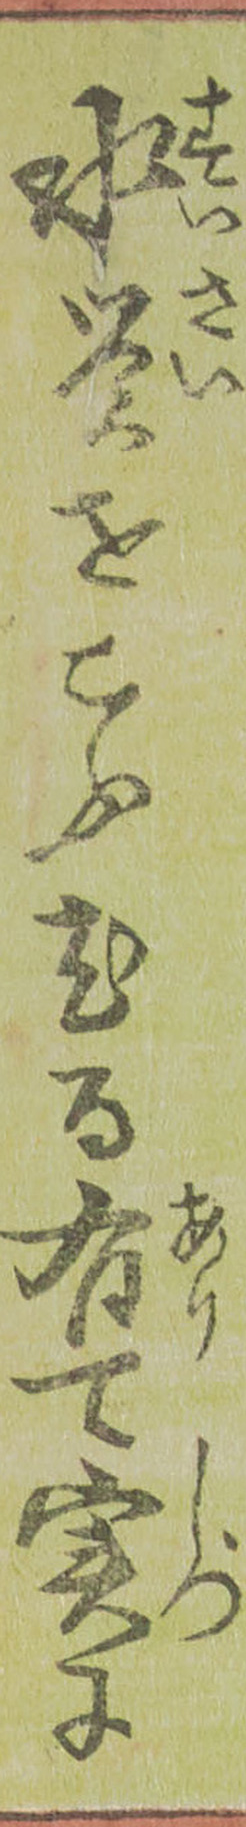水災をこふむる有て実に
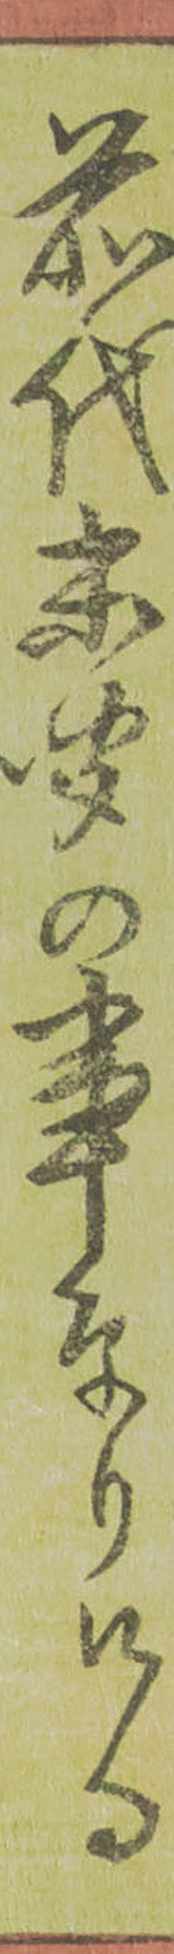前代未聞の事なりける
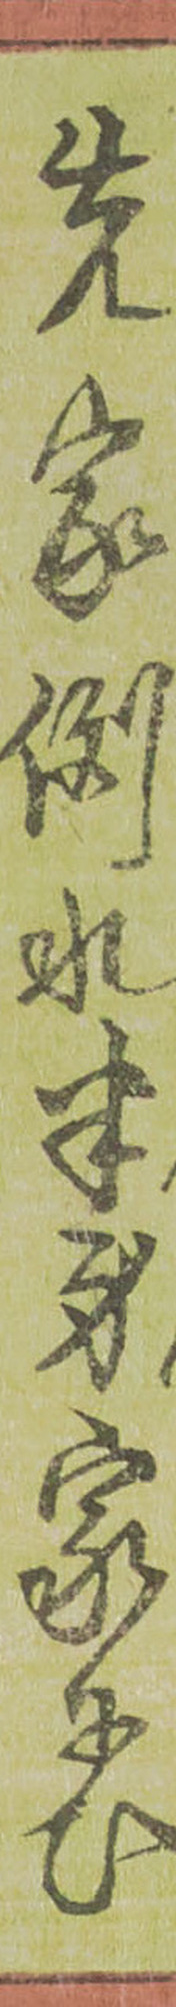先家倒れ半身家にひ
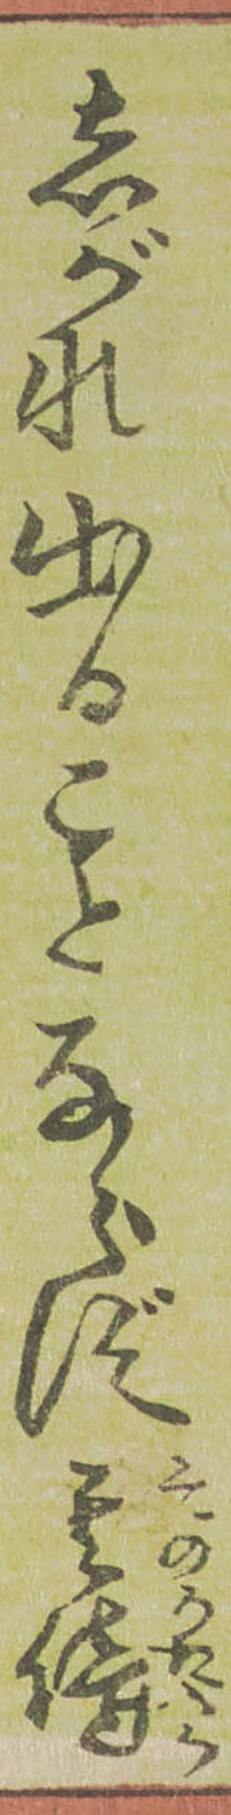しがれ出ることならず其傍
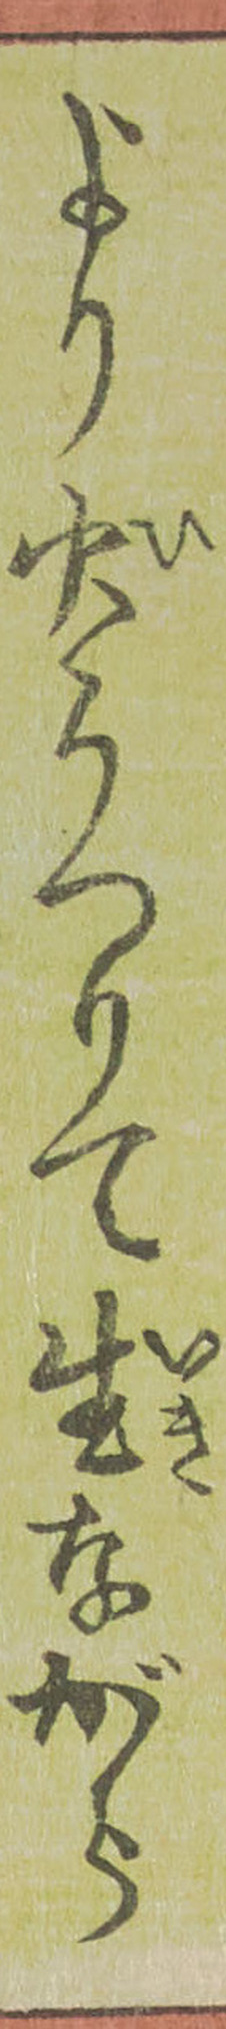より火うつりて生ながら
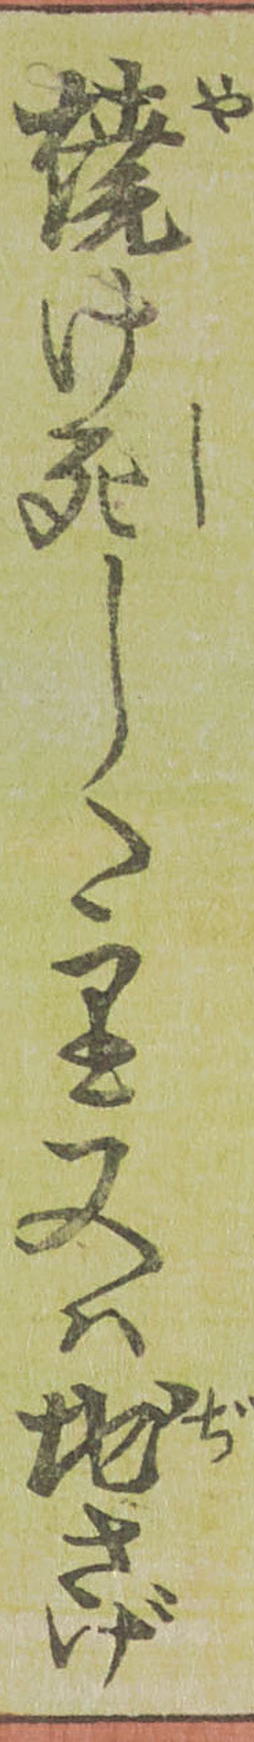焼け死したり又は地さげ
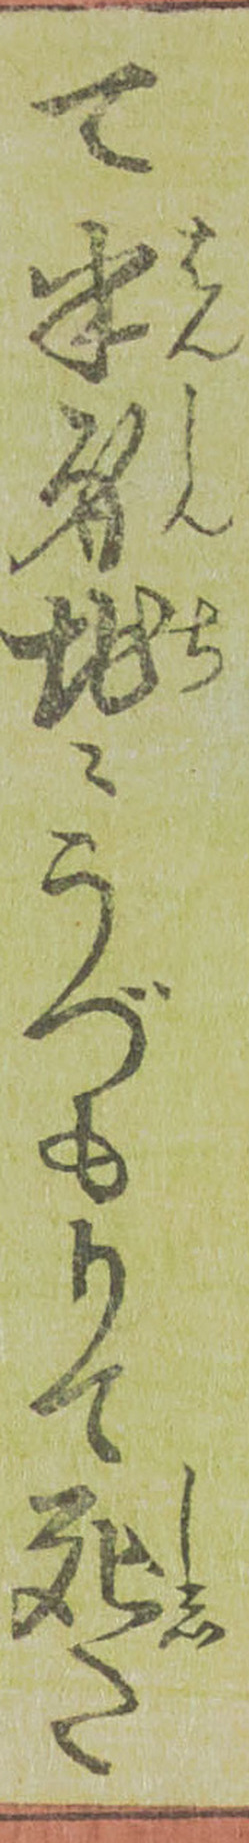て半身地にうづもりて死た
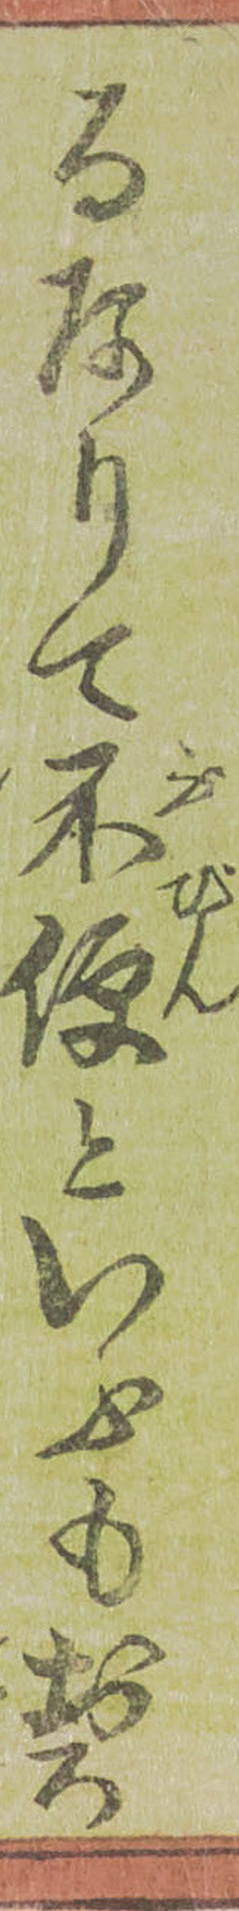るありて不便といふもおろ
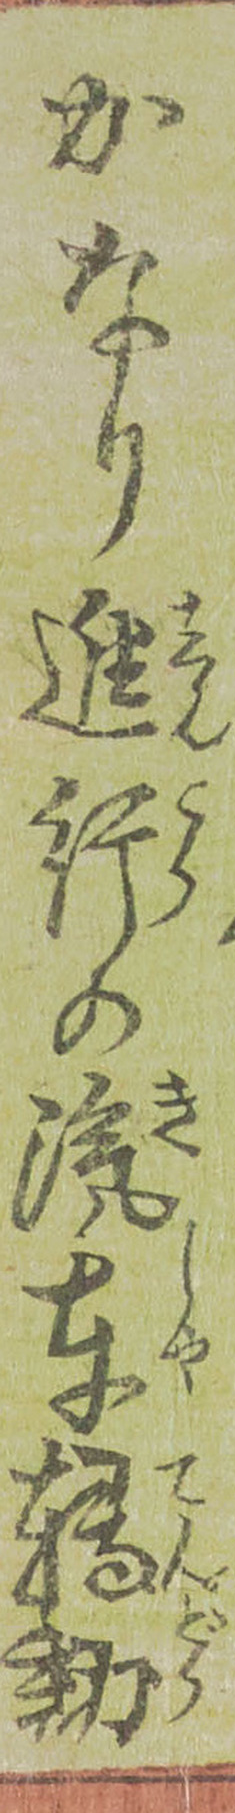かなり進行の汽車轉動
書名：岐阜市街大地震之図
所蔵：東京大学総合図書館 General Library in the University of Tokyo, JAPAN
